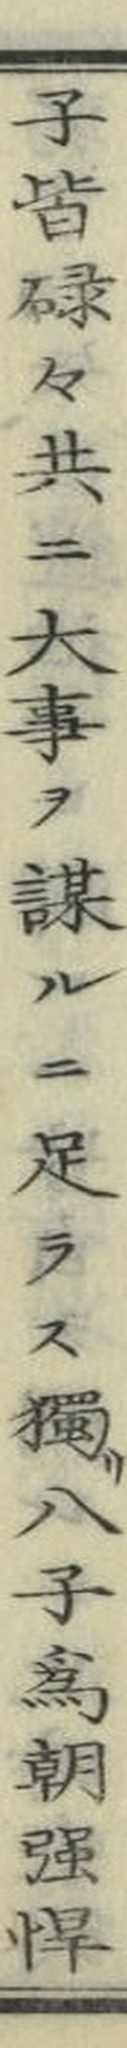子皆碌々共ニ大事ヲ謀ルニ足ラス獨八子爲朝強悍
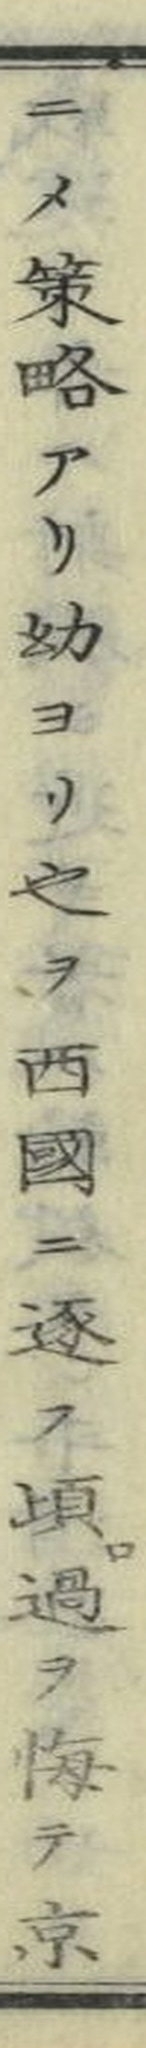ニ乄策略アリ幼ヨリ之ヲ西國ニ逐フ頃過ヲ悔テ京
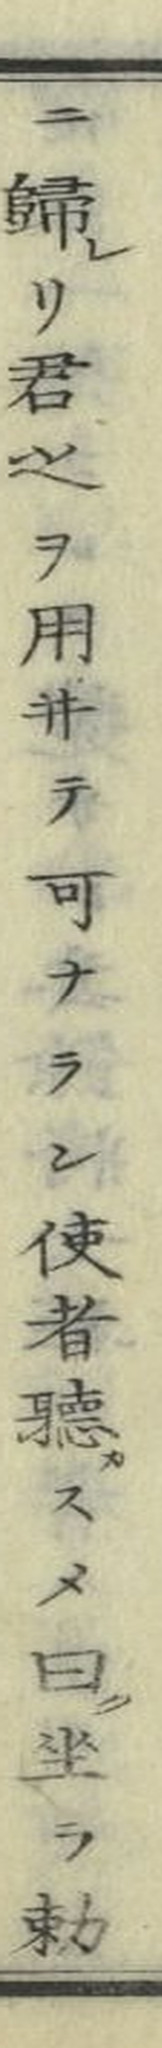ニ歸リ君之ヲ用ヰテ可ナラン使者聽乄曰坐ラ勅
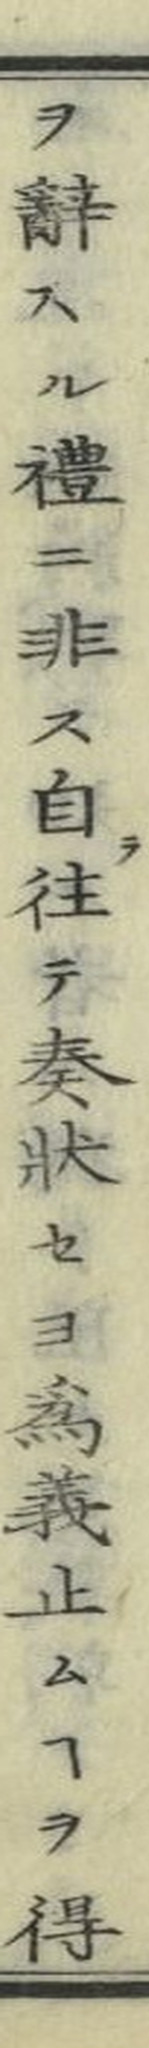ヲ辭スル禮ニ非ス自往テ奏狀セヨ爲義止ムコトヲ得
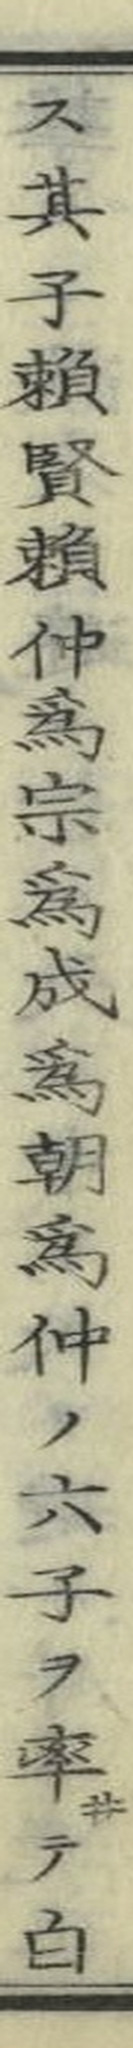ス其子賴賢賴仲爲宗爲成爲朝爲仲ノ六子ヲ率テ白
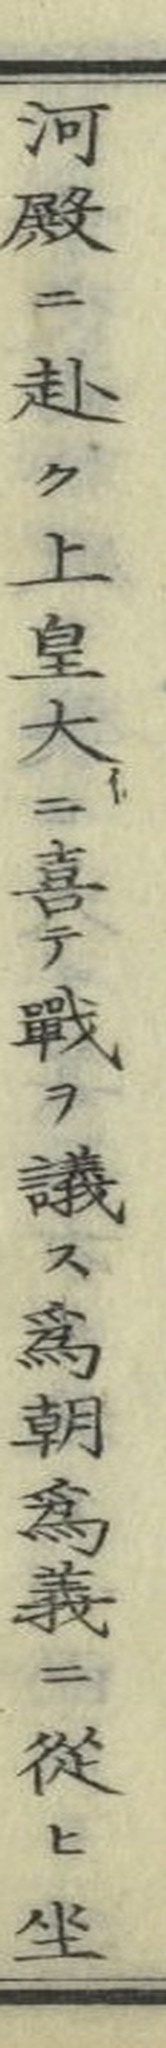河殿ニ赴ク上皇大ニ喜テ戰ヲ議ス爲朝爲義ニ從ヒ坐
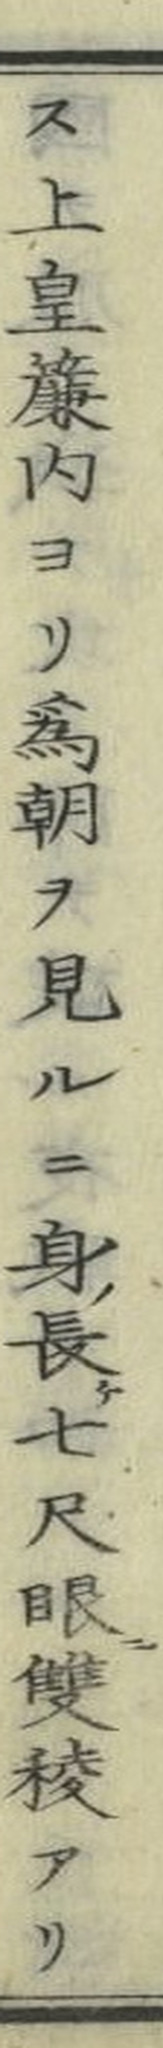ス上皇簾內ヨリ爲朝ヲ見ルニ身長七尺眼雙稜アリ
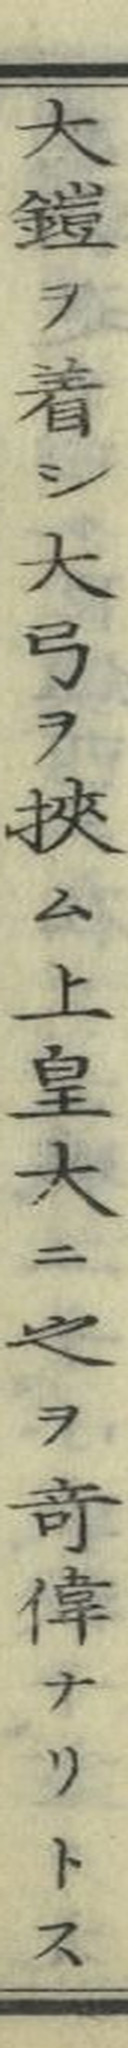大鎧ヲ着シ大弓ヲ挾ム上皇大ニ之ヲ竒偉ナリトス

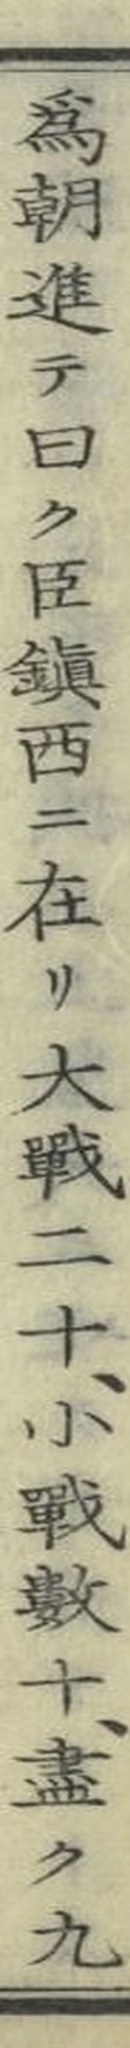爲朝進テ曰ク臣鎭西ニ在リ大戰二十、小戰數十、盡ク九
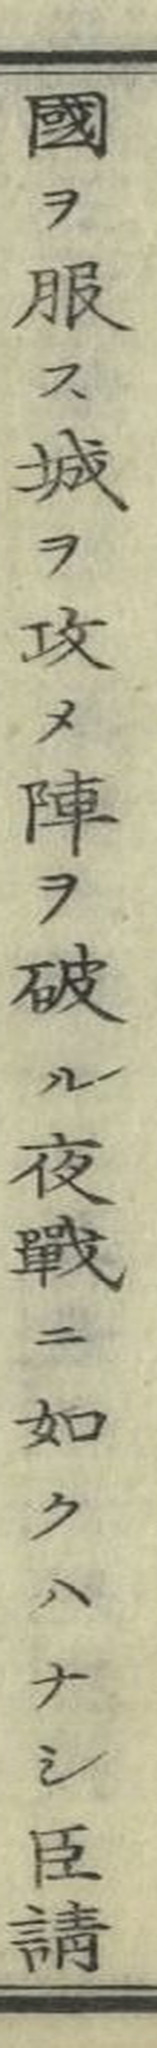國ヲ服ス城ヲ攻メ陣ヲ破ル夜戰ニ如クハナシ臣請
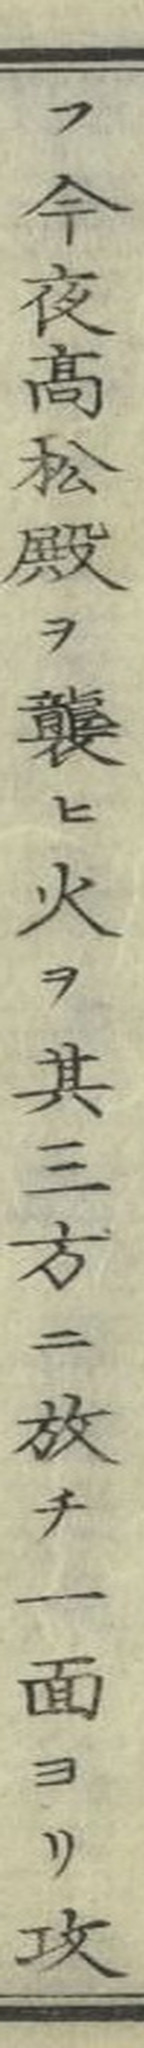ヲ今夜髙松殿ヲ襲ヒ火ヲ其三方ニ放チ一面ヨリ攻
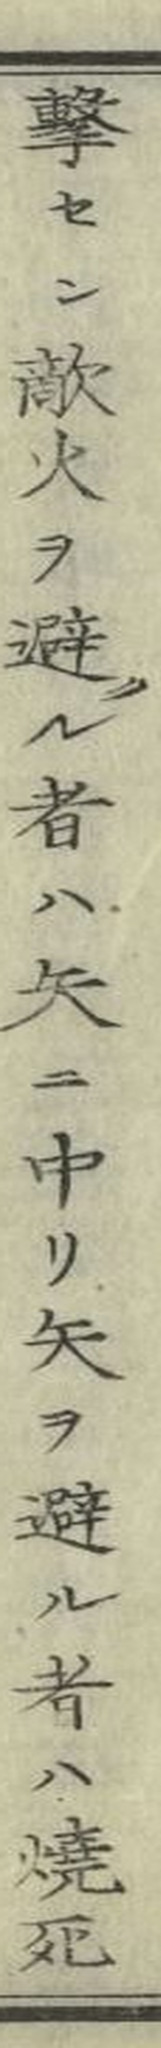擊セン歒火ヲ避ル者ハ中リ矢ヲ避ル者ハ燒死
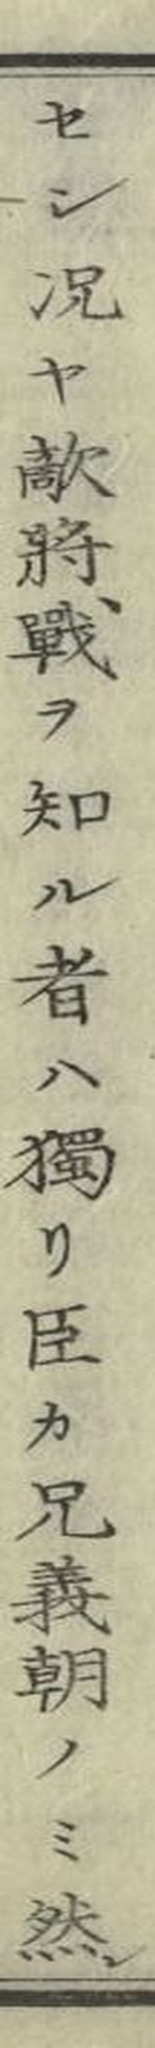セン況ヤ歒將、戰ヲ知ル者ハ獨リ臣カ兄義朝ノミ然レ
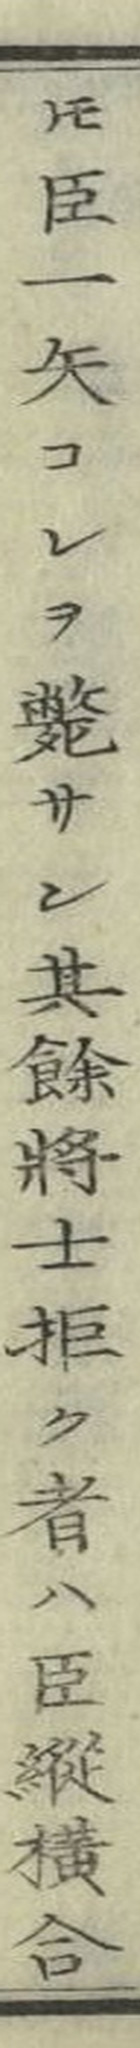トモ臣一矢コレヲ斃サン其餘將士拒ク者ハ臣縱橫合
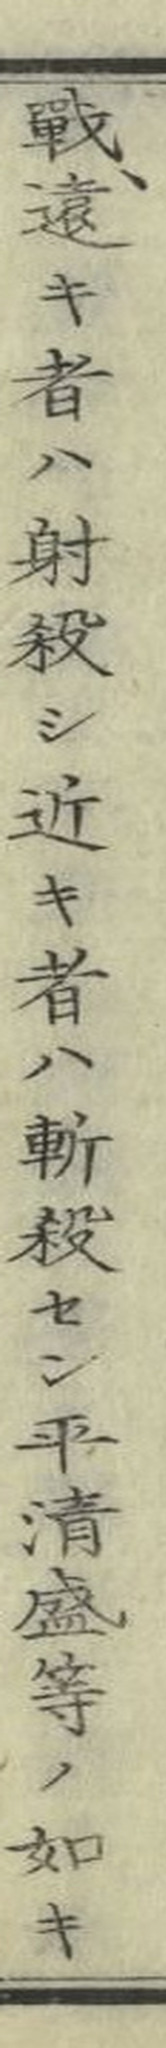戰、遠キ者ハ射殺シ近キ者ハ斬殺セン平清盛等ノ如キ
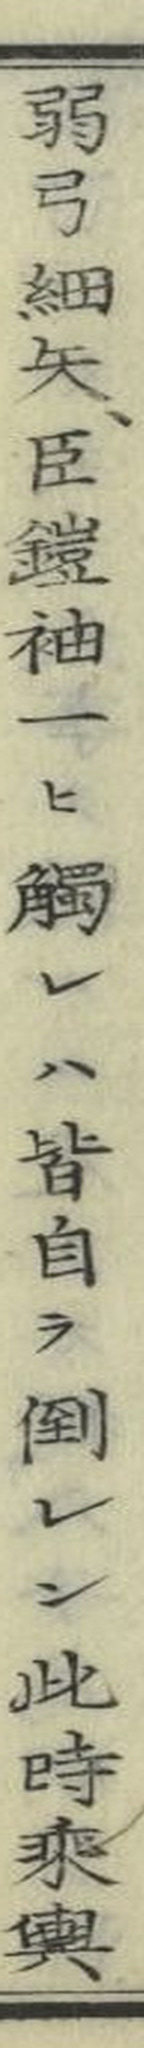弱弓細矢、臣鎧袖一ヒ觸レハ皆自ラ倒レン此時乘輿
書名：琉球藩史 一之巻
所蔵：University of the Ryukyus Library
